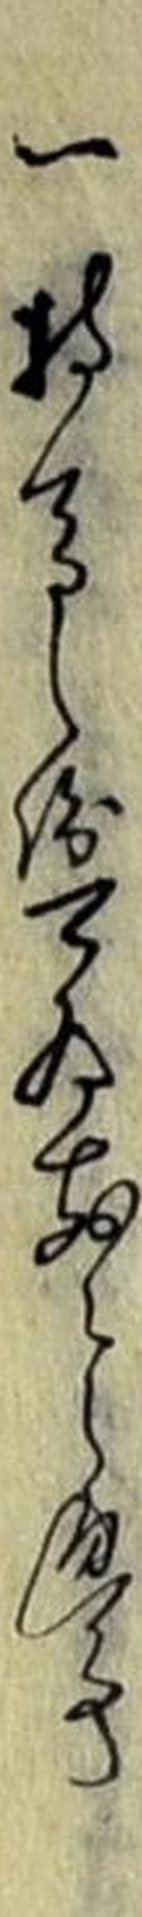一持馬之儀可為前々通事
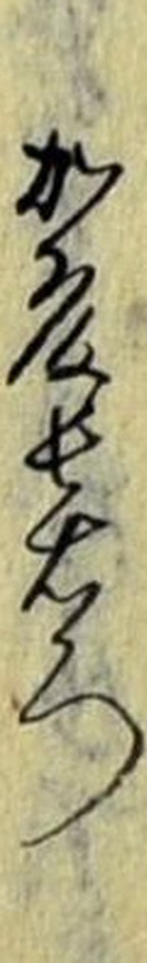加藤長右衛門

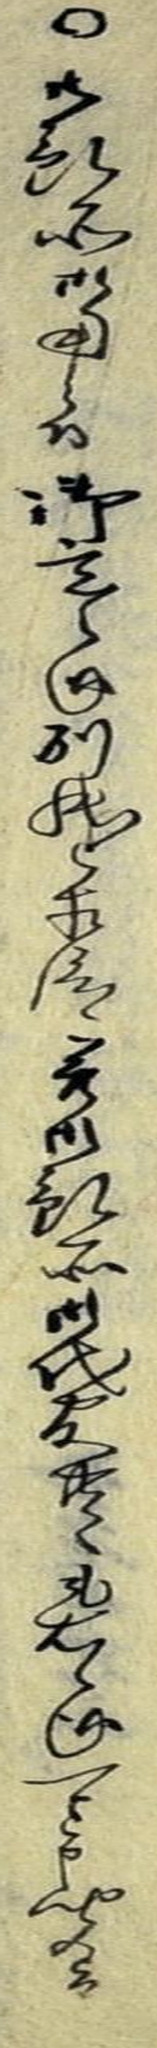〇御預所御用に付御意之趣別紙被相渡候并御預所御代官共へも右之趣可被申聞旨
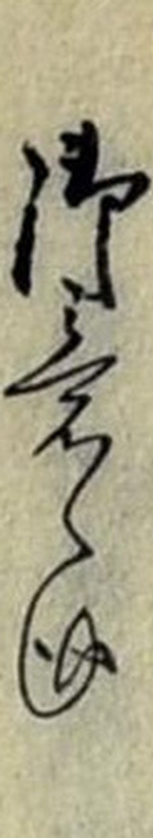御意之趣
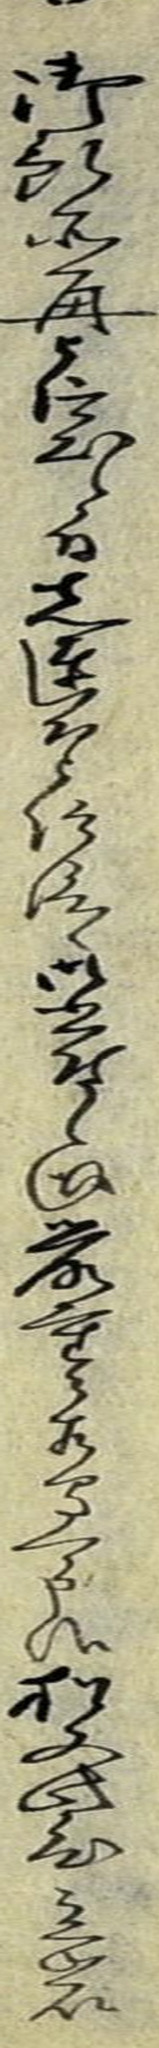〇御預所再被仰付候に付先達而被仰渡候御書付之趣厳重に相守可申候猶又此度立岩
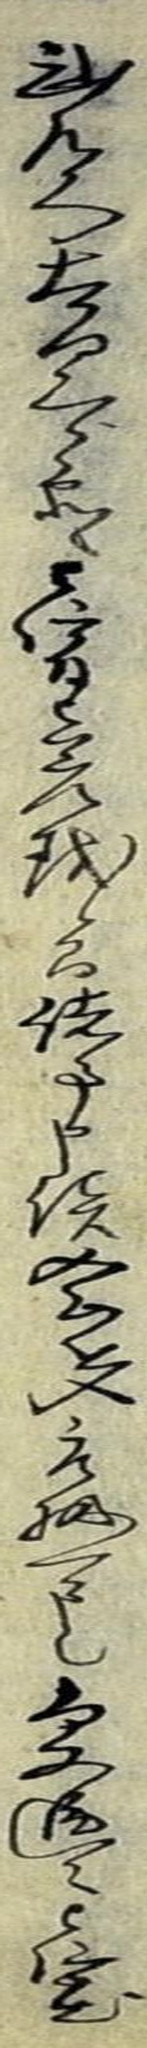武左衛門太田三郎兵衛へ被仰付被差越候間諸事申談念を入取扱可申候尚又追々被仰出
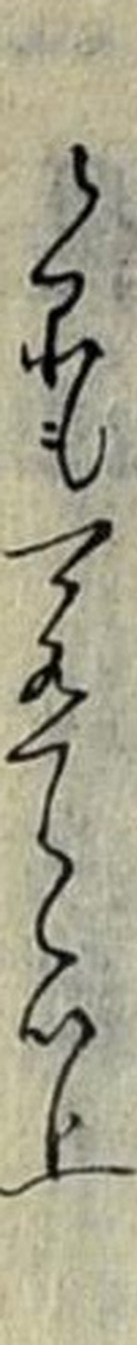候品も可有之候以上
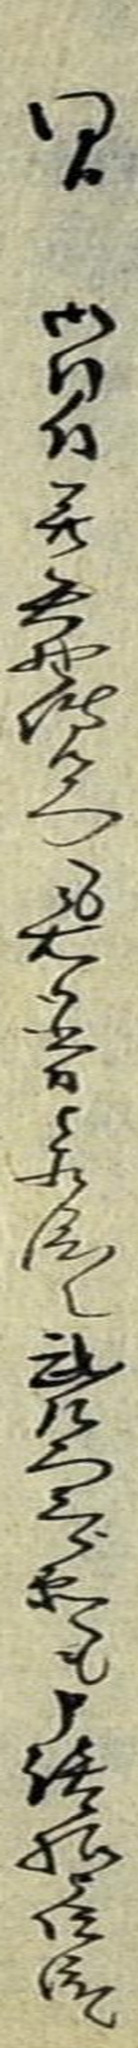同日御目付并矢野伝左衛門へも右御書付被相渡之武左衛門三郎兵衛へも申談候様被仰渡之
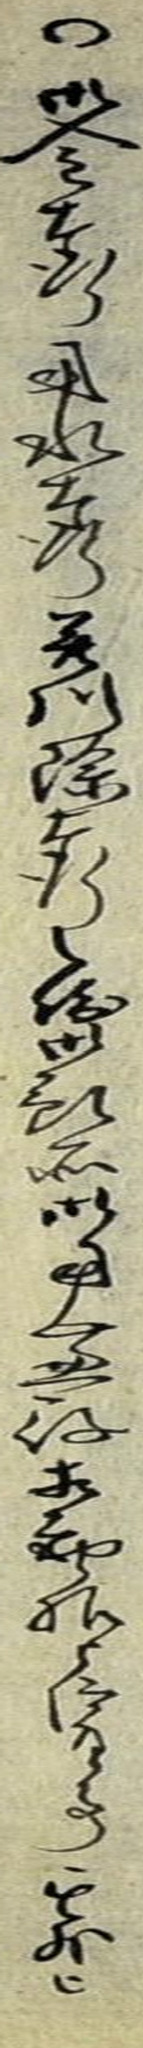〇御金奉行用水奉行并川除奉行之儀御預所御用兼役相勤候様被仰付候事其外被
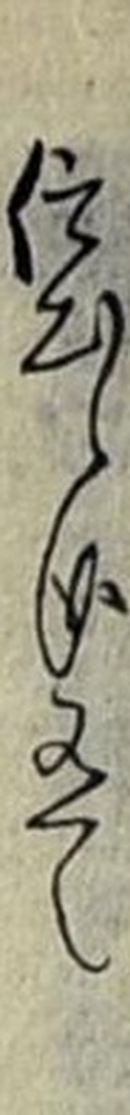仰出候趣有之
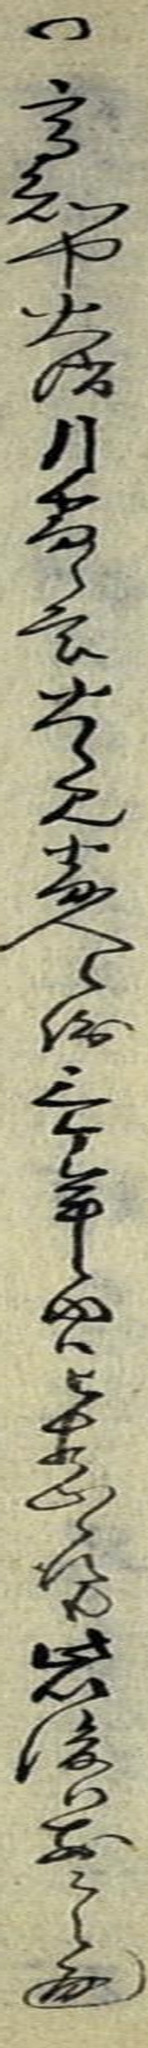〇高知中火消月番之節火之見番人之儀三ヶ年之内は被相止候得共此以後は前々之通
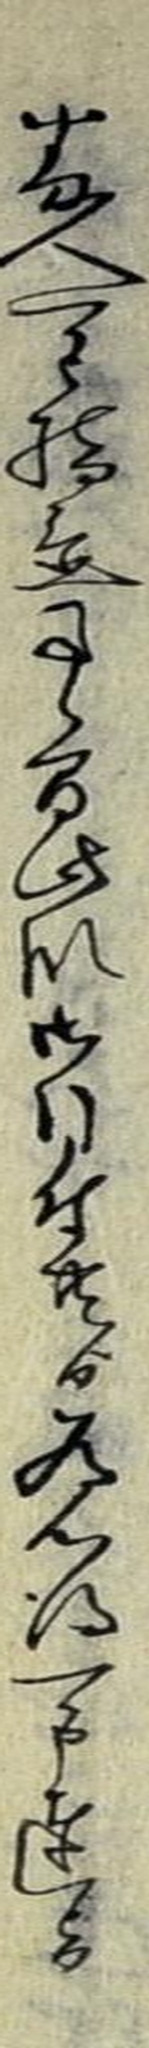番人可被指置事候間此段御目付共ゟ為心得可申達旨
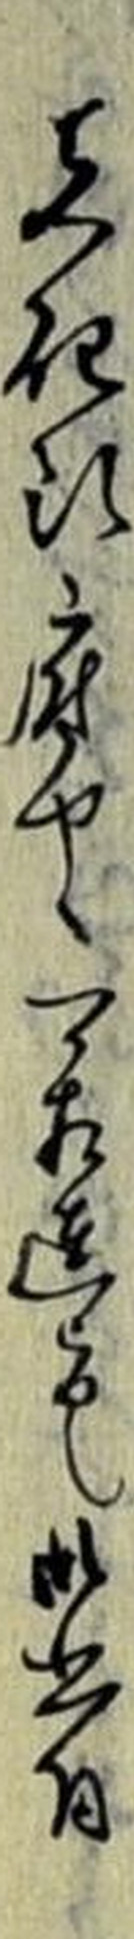支配頭府中へ可相達旨之御書付
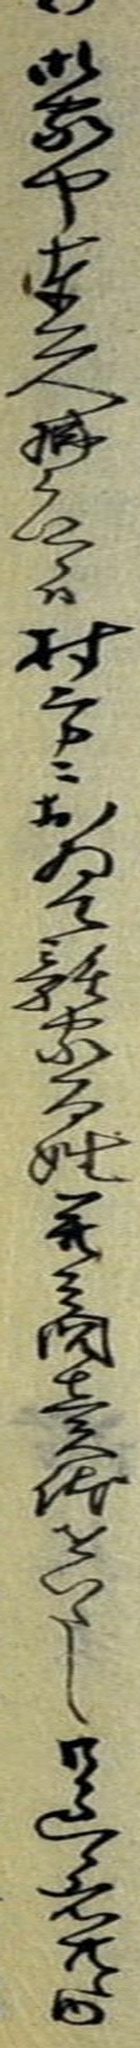〇御家中奉公人払底に付村方におゐて雑家百姓并商売体をいたし口過候者共之内
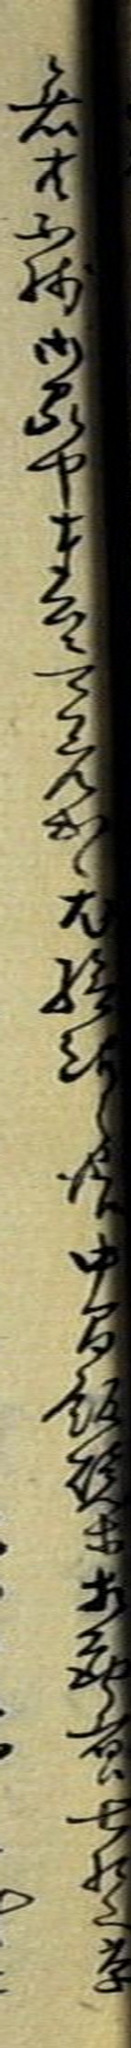候者共不残御家中奉公に可差出候尤給銀之儀は中間飯焼等相勤之者は七拾匁草
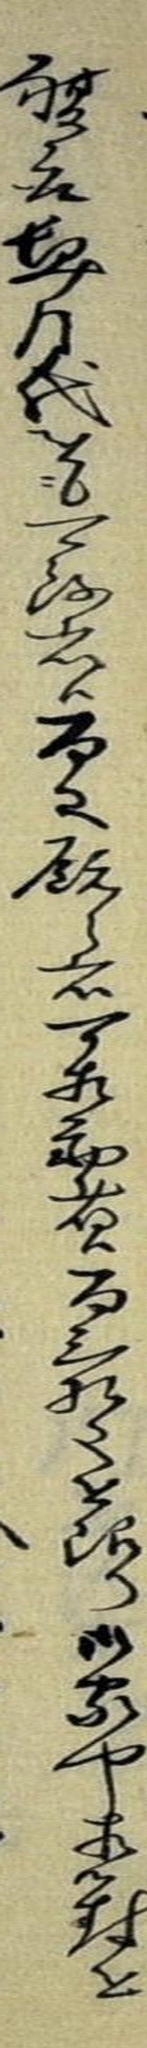履取髪月代をも可致者は百匁厩之者可相勤者は百三拾匁を限り御家中相対を
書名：命令之部 二
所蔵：福井県文書館 Fukui Prefectural Archives
